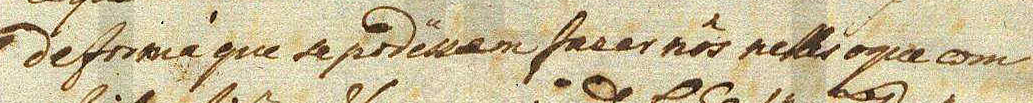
de forma que se podessem fazer nós nelles o que com
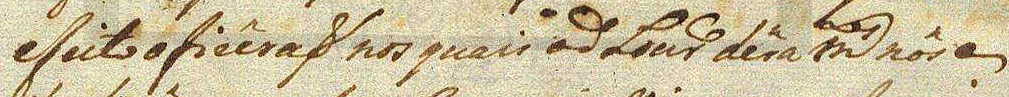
efeito o ficéraõ nos quais o do Lourco déra mtos nós e
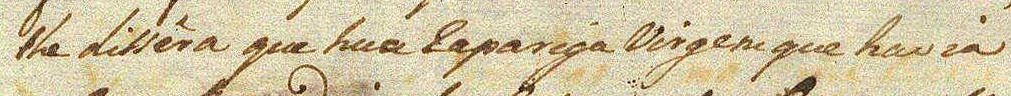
lhe dissera que hua Rapariga Virgem que hauia
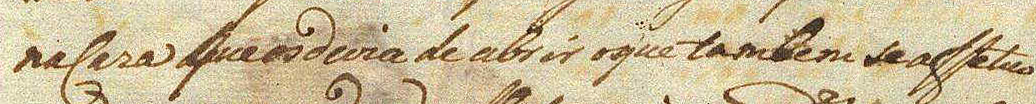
na Caza que os devia de abrir o que tambem se affetuo
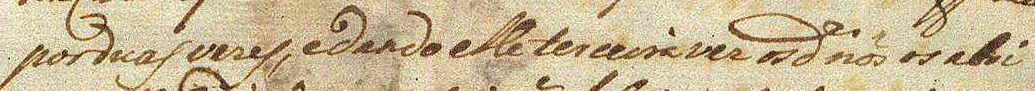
por duas vezes, e dando elle terceira vez os dos nós os abri
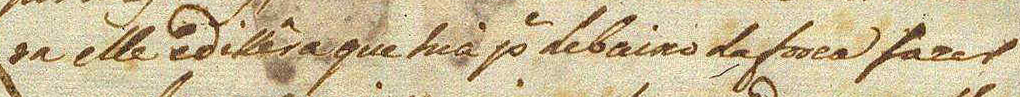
ra elle e disséra que hia pa debaixo da forca fazer
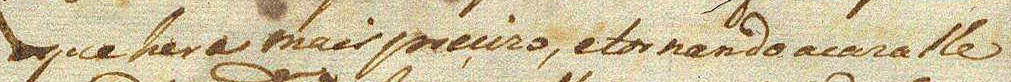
_que hera mais preçizo, e tornando a caza lhe
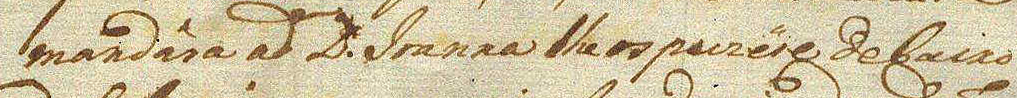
mandára a da D. Ioanna lhe os puzése debaixo
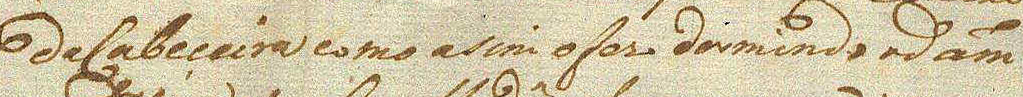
da Cabeçeira, como asim o fez dormindo o d.o amo
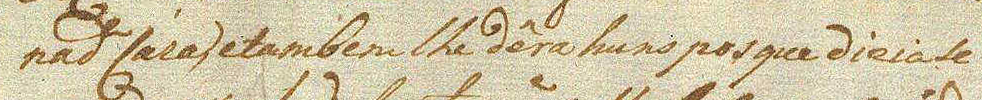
na da Caza, e tambem lhe déra huns pos que dizia se
